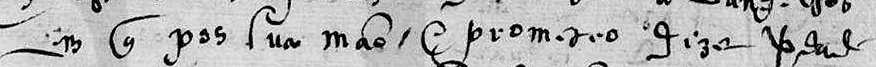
em q̄ pos sua mão / e prometeo dizer ꝟdade
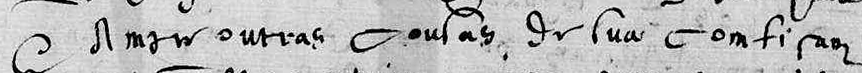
e Amtre outras cousas de sua comfisam
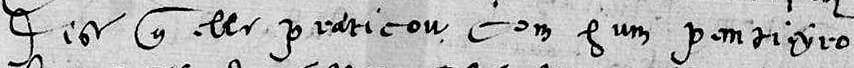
dise q̅ elle praticou com hum pemtieyro
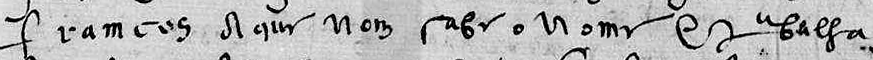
framces A que nom sabe o nome e tabalha
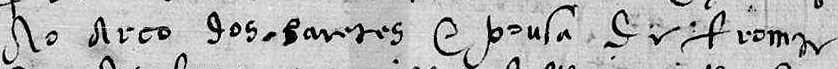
Ao Arco dos baretes e pousa defromte
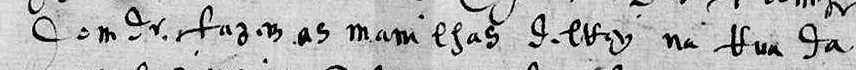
domde fazem as manilhas del Rey na Rua da
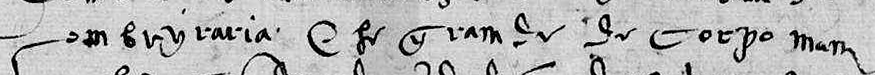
sombryraria e he gramde de corpo mam
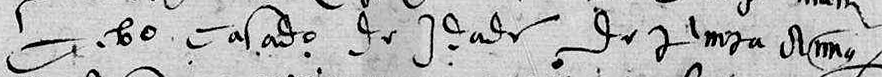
Cebo casado de Jdade de timta Annꝯ /
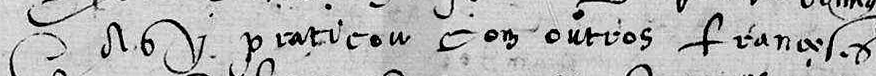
e Asy praticou com outros franceses
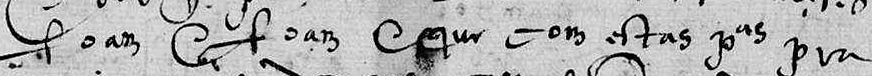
foam e foam e que com estas pas pra
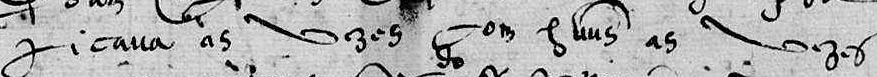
ticaua as vezes com hūus as vezes
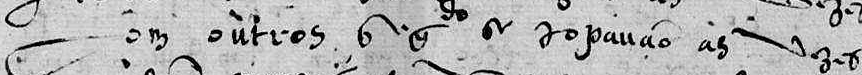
Com outros segdo se topauão as vezes
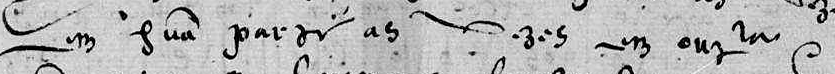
em hūa parte as vezes em outra e
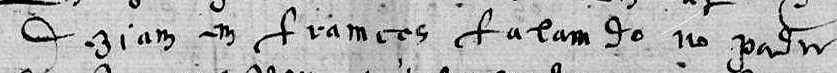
deziam em framces falamdo no padre
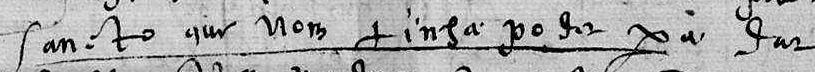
sancto que nom tinha poder ꝑa dar
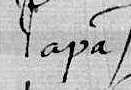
Papa
